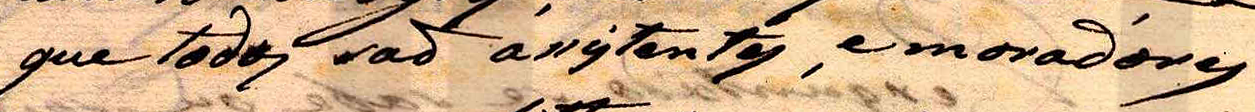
que todos saõ assistentes, e moradores
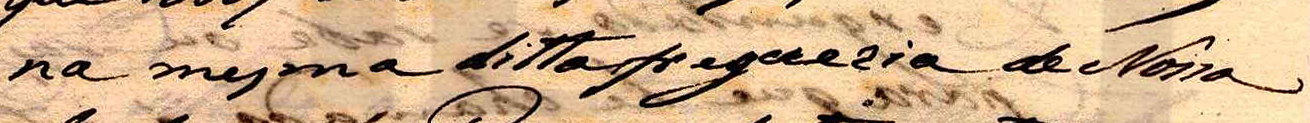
na mesma ditta freguezia de Nossa
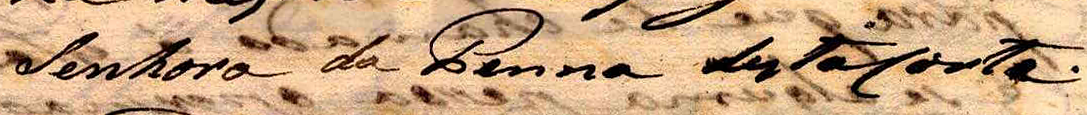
Senhora da Penna desta Corte.
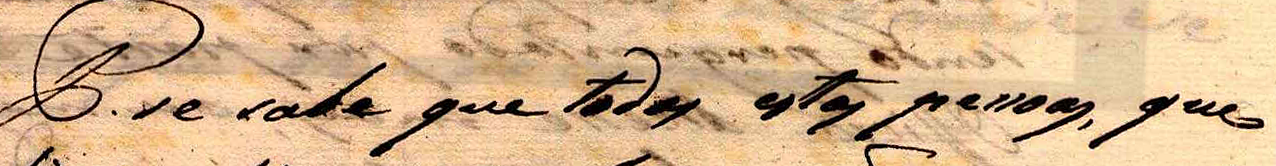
P. se sabe que todas estas pessoas, que
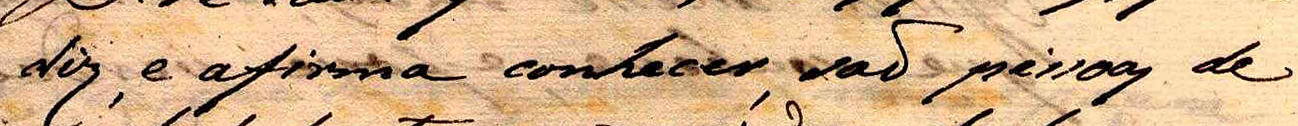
diz, e afirma conhecer saõ pessoas de
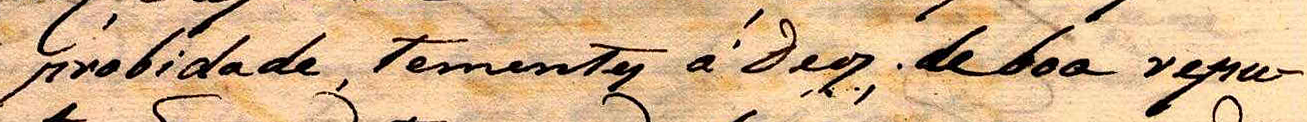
probidade tementes á Deos; de boa repu
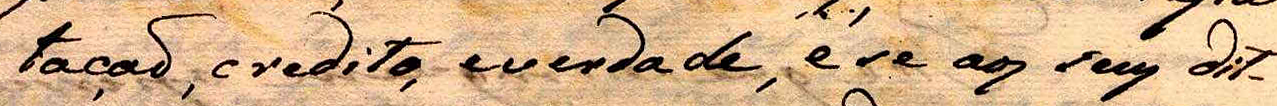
taçaõ, credito, e verdade, e se aos seus dit
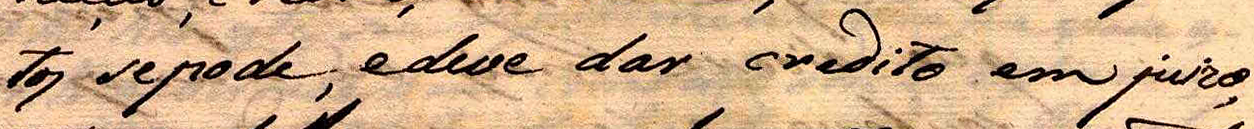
tos se pode, e deve dar credito em juizo
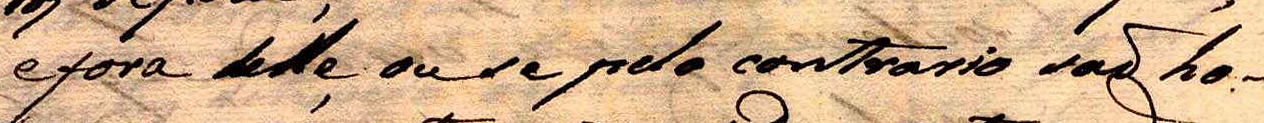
e fora delle, ou se pelo contrario saõ ho
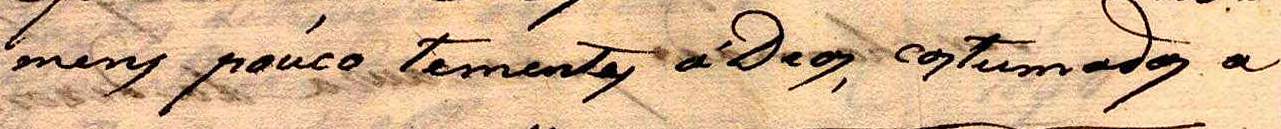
mens pouco tementes á Deos, costumados a
